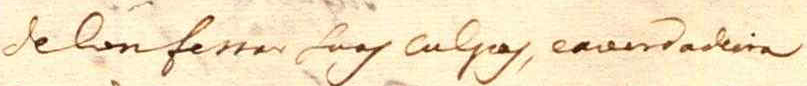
de Confessar suas culpas, e a verdadeira
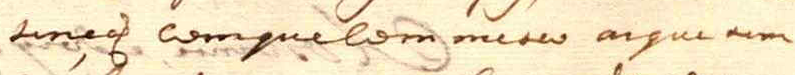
tençaõ com que commeteo as que tem
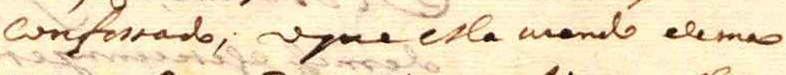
confessado, o que ella uzando de mao
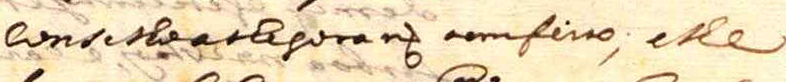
conselho athe gora nõ tem feito; e lhe
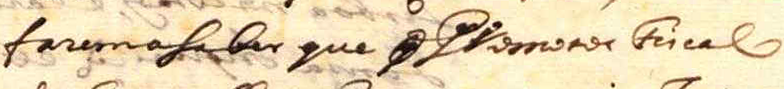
fazem a saber que o Promotor Fiscal
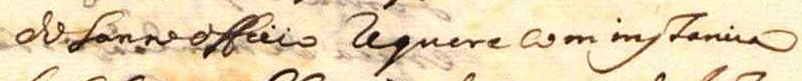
do santo officio Requere com instancia
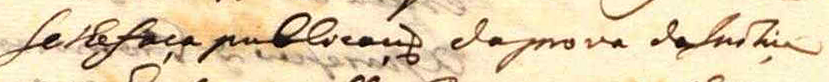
se lhe faça publicaçaõ da prova de Iustiça
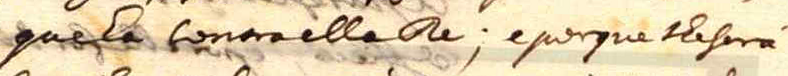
que ha contra ella Re; e porque lhe será
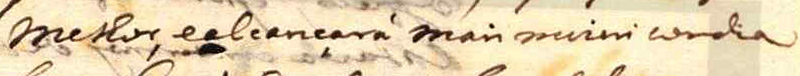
melhor, e alcançara mais mizericordia
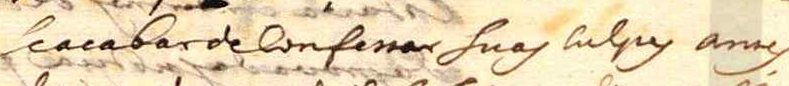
se acabar de Confessar suas culpas antes
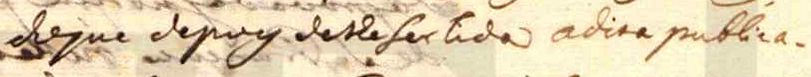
do que depois de lhe ser lida a dita publica
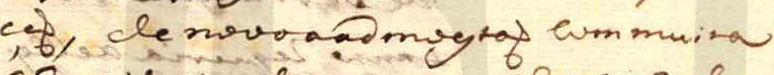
çaõ, de novo a admoestaõ com muita
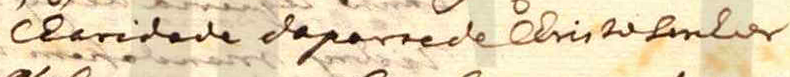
charidade da parte de Christo senhor
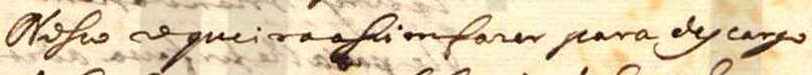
Nosso o queira assim fazer para descargo
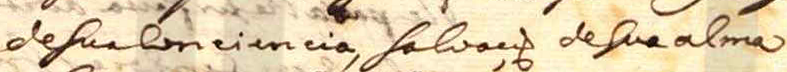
de sua conciencia, salvaçaõ de sua alma
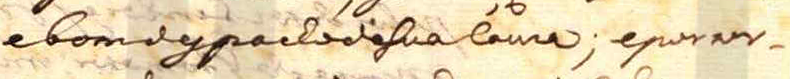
e bom despacho de sua cauza; e por tor
